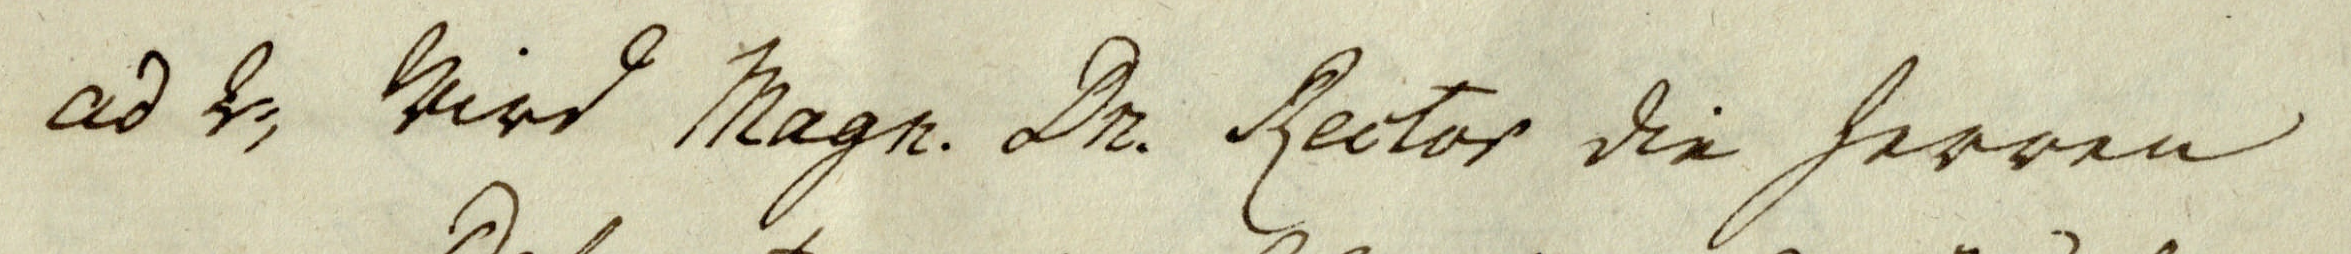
ad 2., Wird Magn. Dn. Rector die Herren
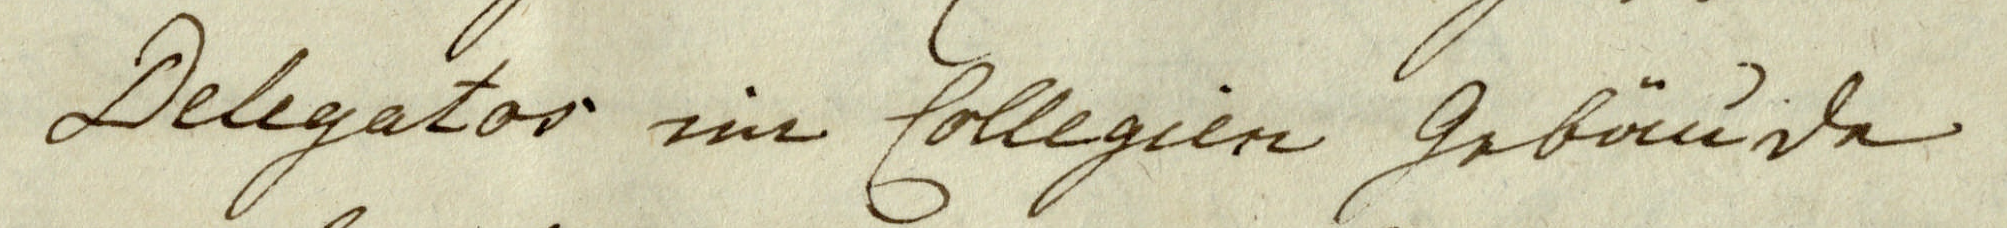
Delegatos im Collegien Gebäude
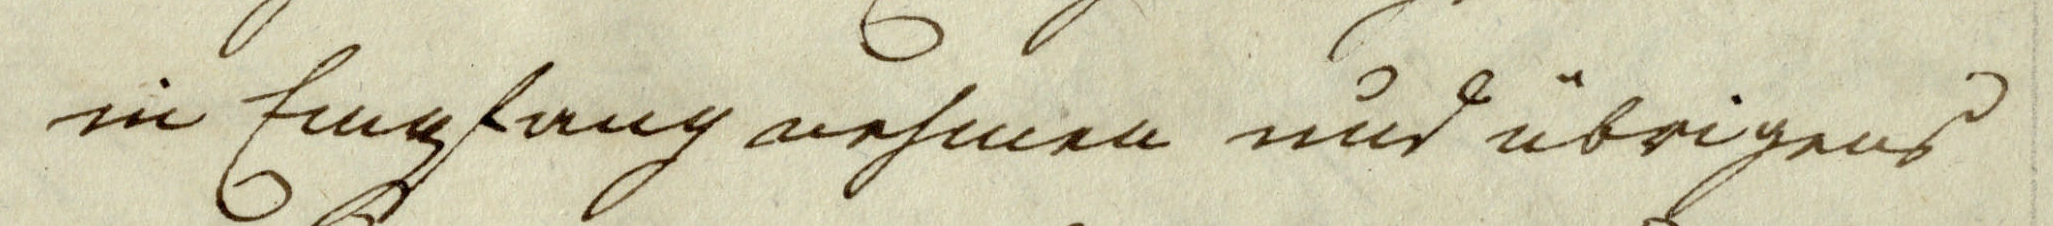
in Empfang nehmen und übrigens
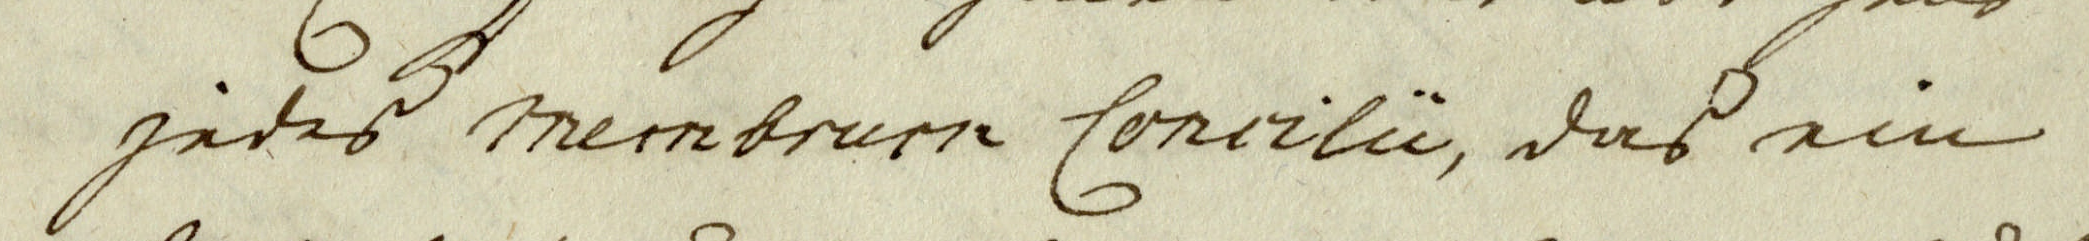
jedes Membrum Concilii, das ein
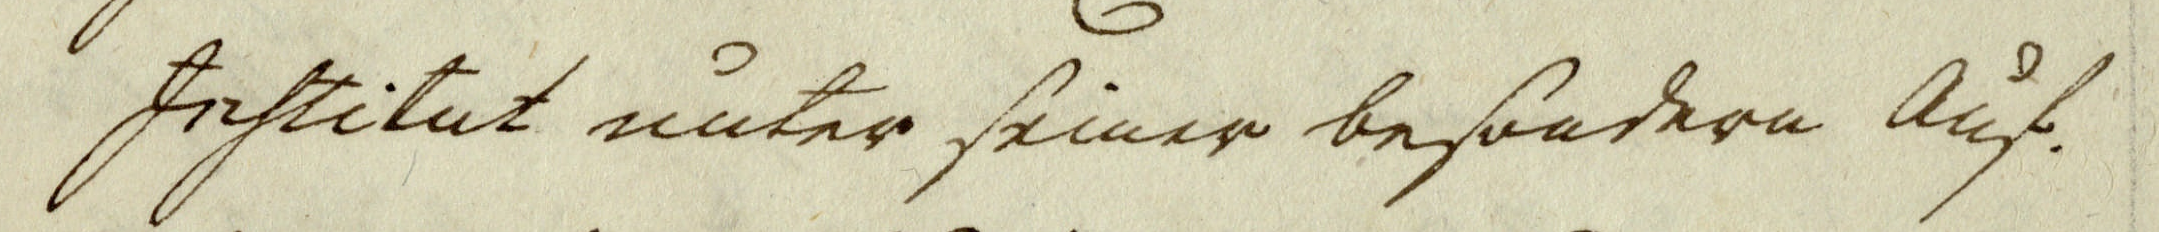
Institut unter seiner besondern Auf¬
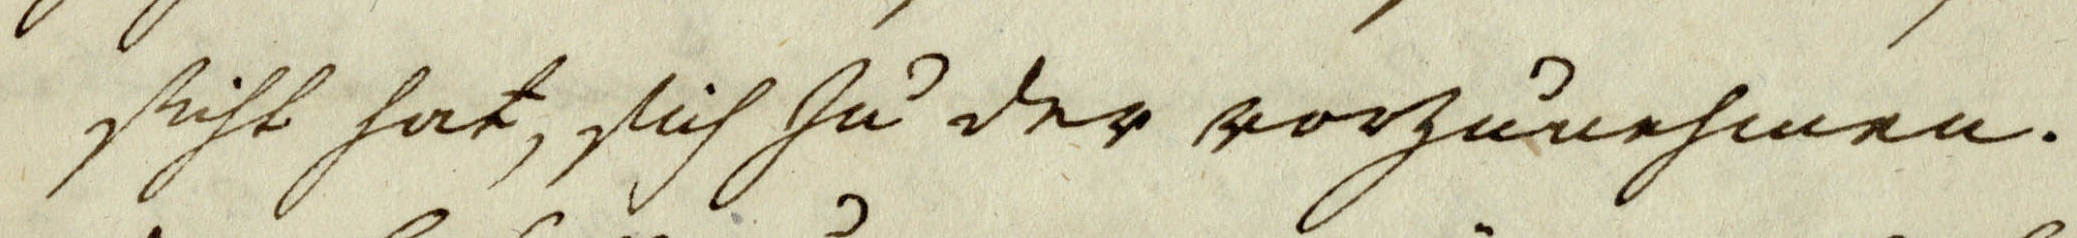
sicht hat, sich zu der vorzunehmen¬
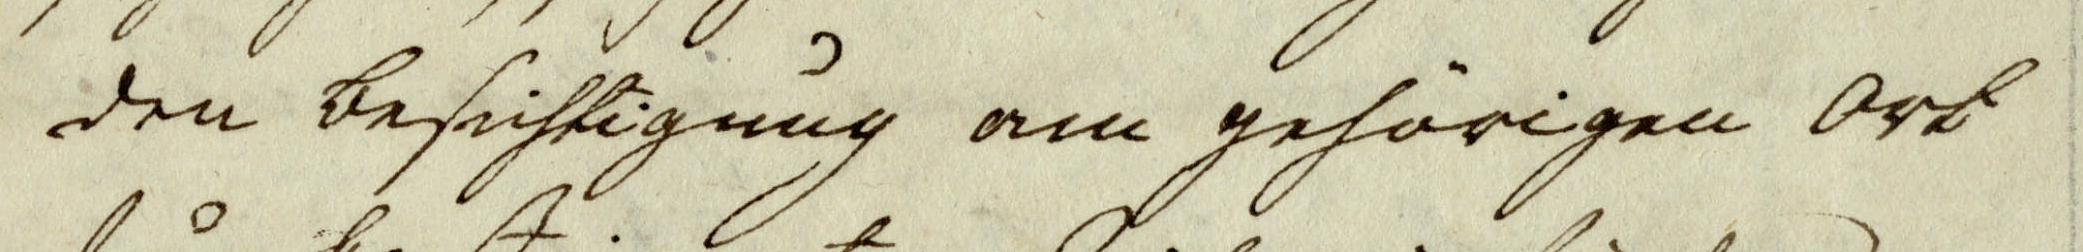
den Besichtigung am gehörigen Ort
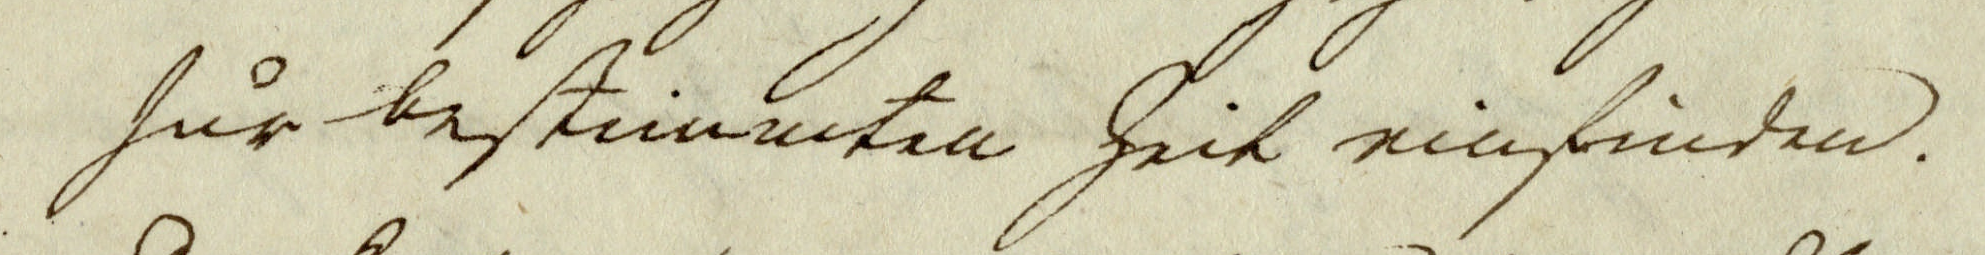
zur bestimmten Zeit einfinden.
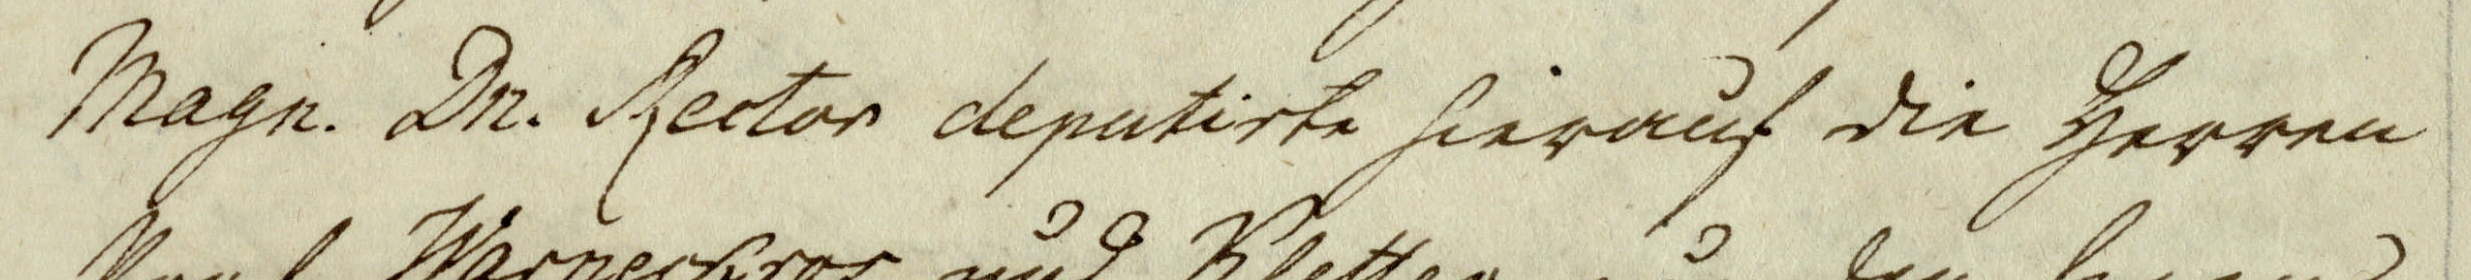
Magn. Dn. Rector deputirte hierauf die Herren
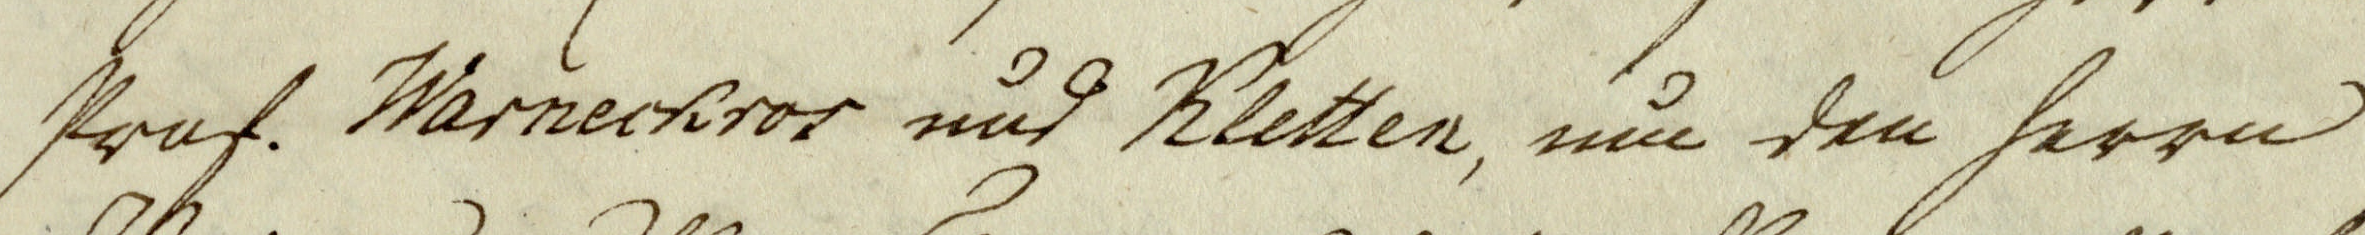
Prof. Warneckros und Kletten, um den Herrn
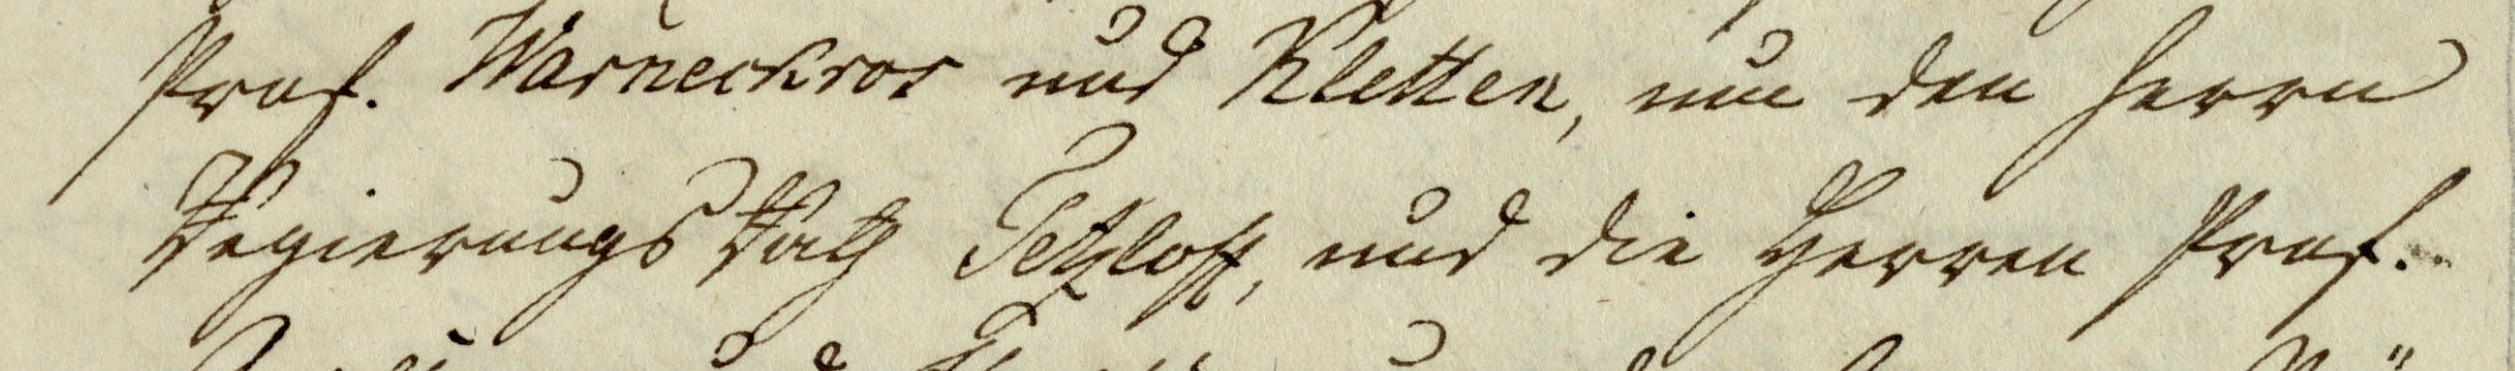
Regierungs Rath Tetzloff, und die Herren Prof.
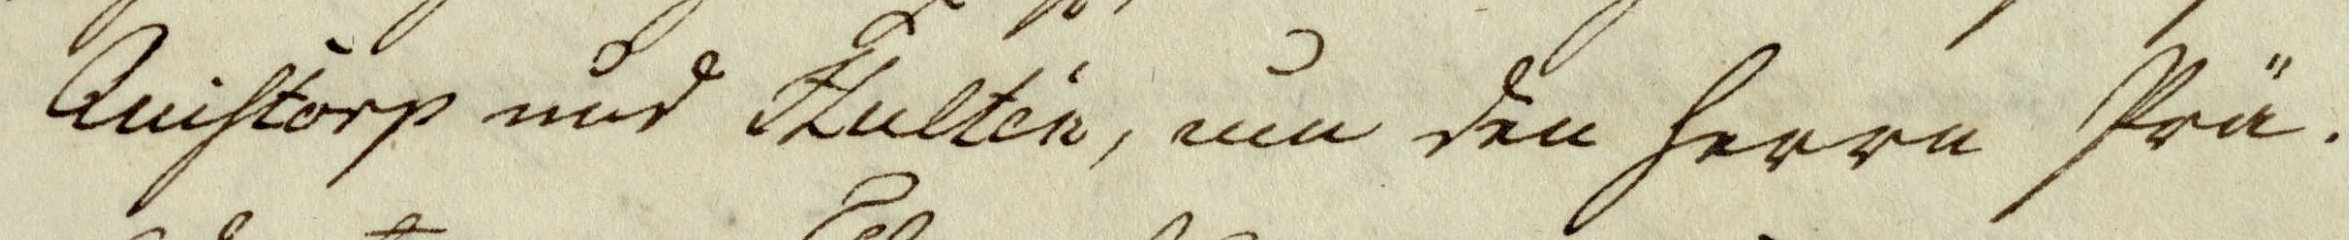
Quistorp und Hulten, um den Herrn Prä¬
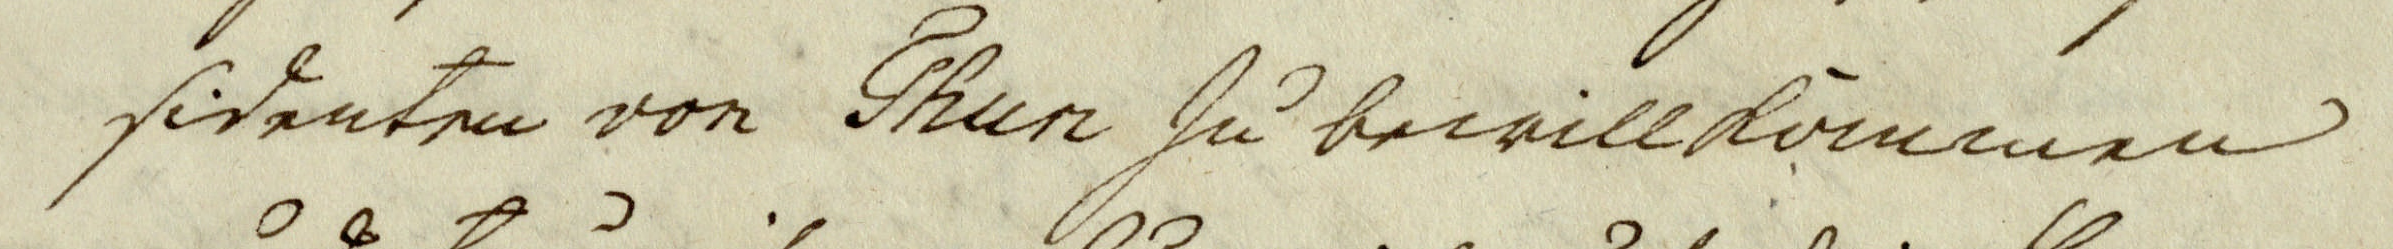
sidenten von Thun zu bewillkommen
